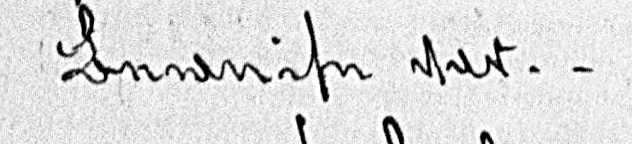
Beweise vor.-
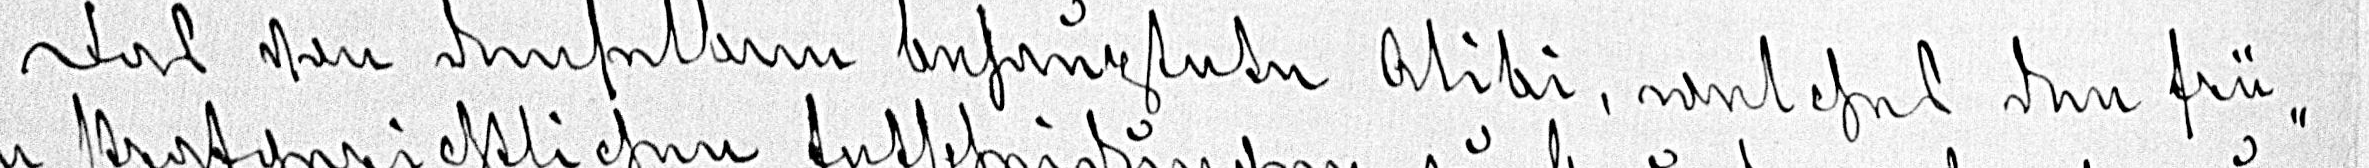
Das von denselben behauptete Alibi, welches den frü¬
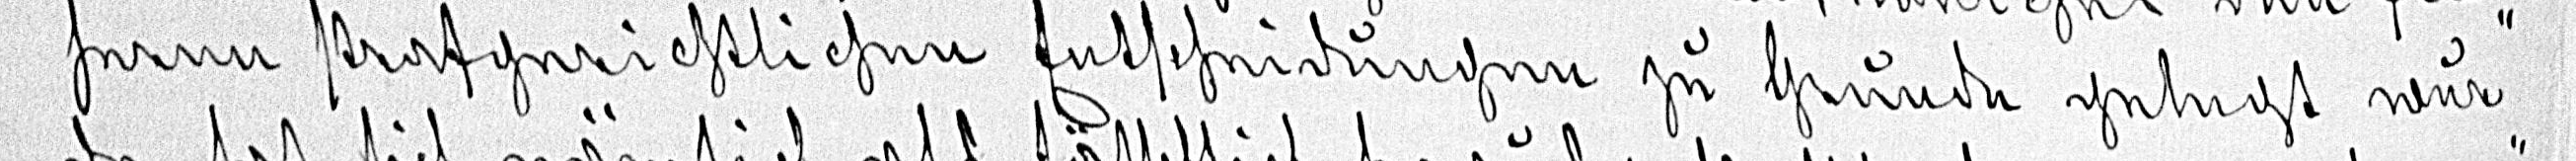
heren strafgerichtlichen Entscheidungen zu Grunde gelegt wur¬
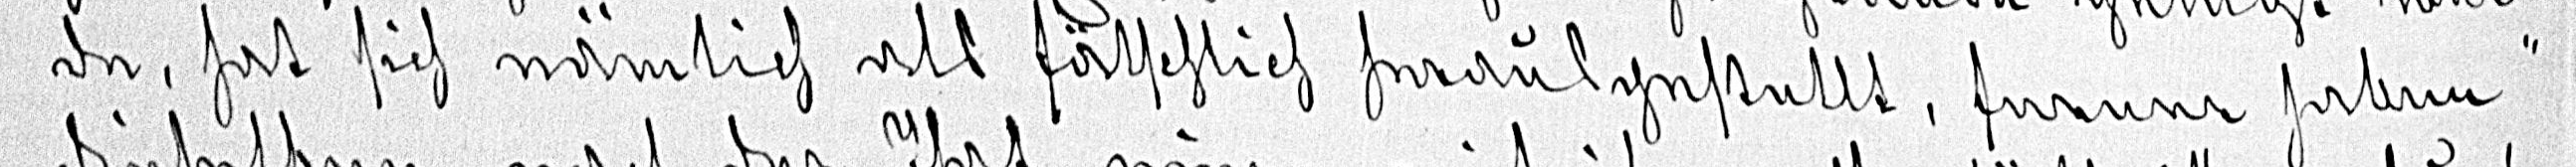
de, hat sich nämlich als fälschlich herausgestellt, ferner haben
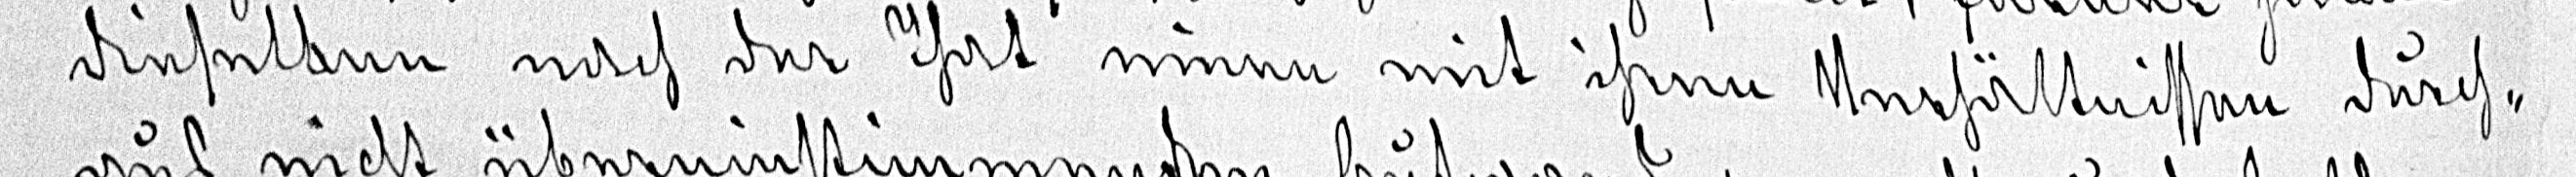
dieselben nach der That einen mit ihren Verhältnissen durch¬
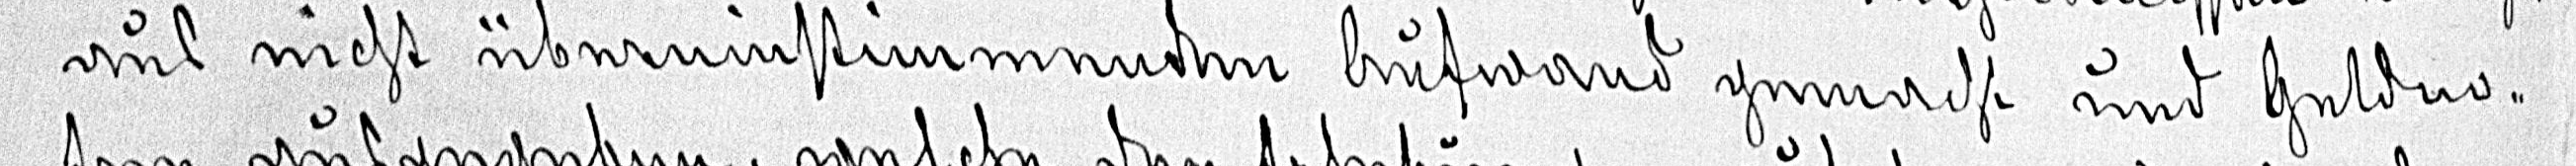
aus nicht übereinstimmenden Aufwand gemacht und Geldno¬
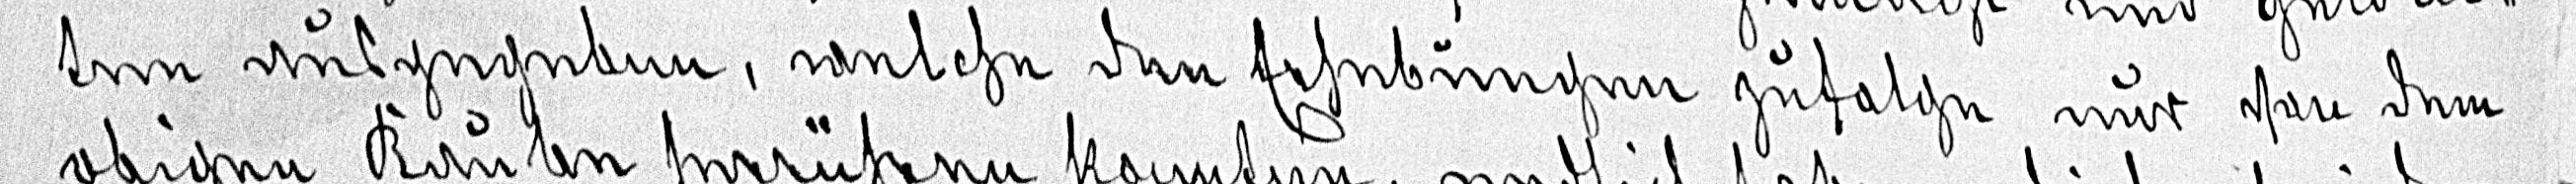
ten ausgegeben, welche den Erhebungen zufolge nur von dem
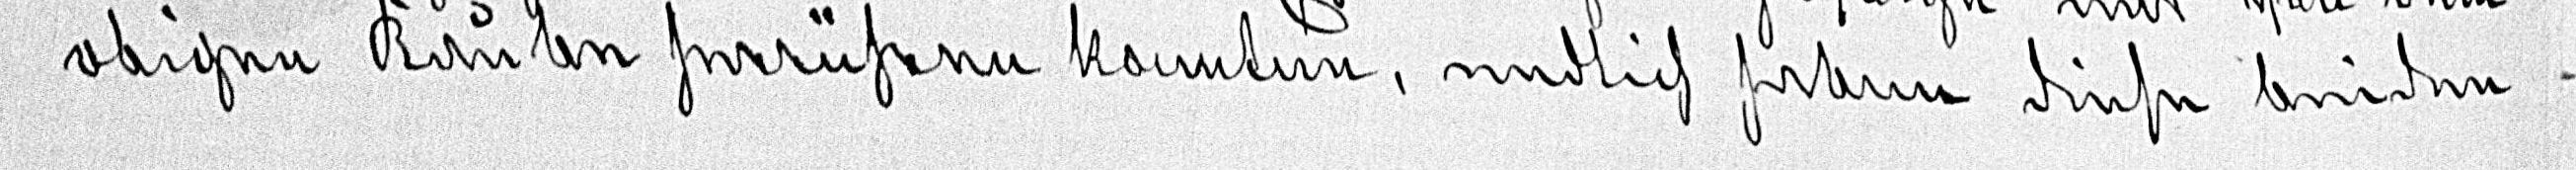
obigen Raube herrühren konnten, endlich haben diese beiden.
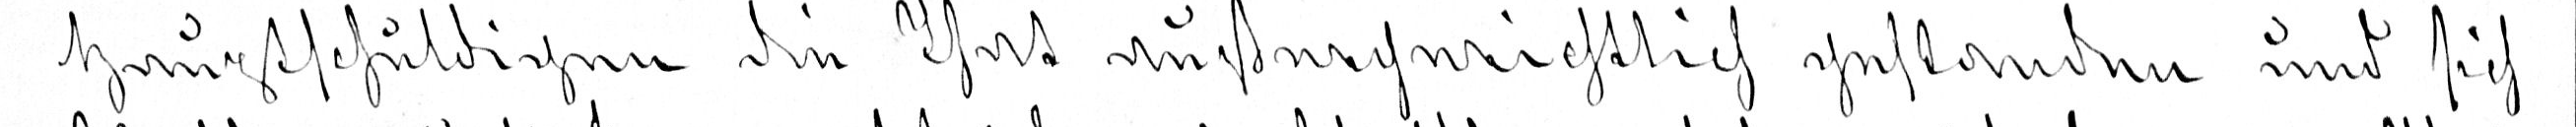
Hauptschuldigen die That außergerichtlich gestanden und sich
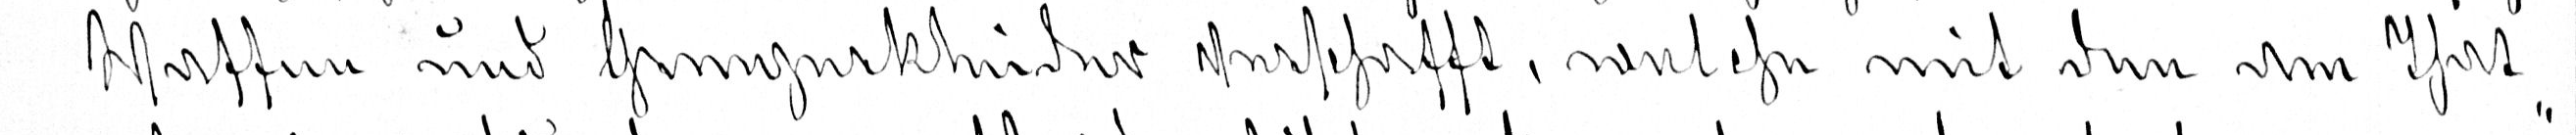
Waffen und Grenzerkleider verschafft, welche mit den am That¬
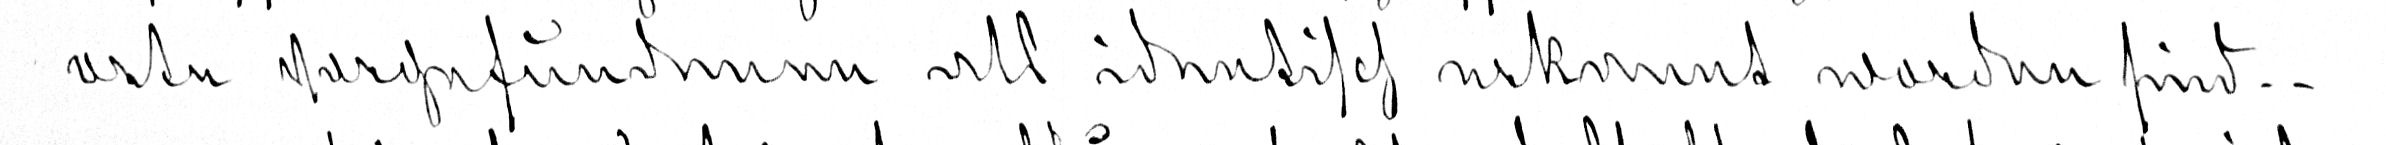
orte vorgefundenen als identisch erkannt worden sind.-
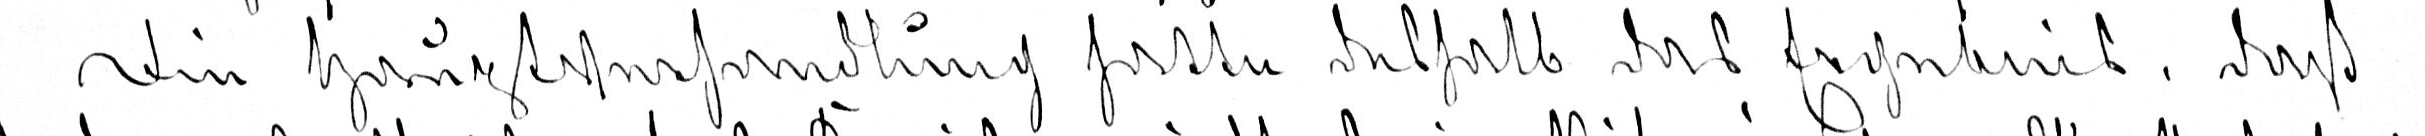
Die Hauptverhandlung hatte deshalb das Ergebnis, daß
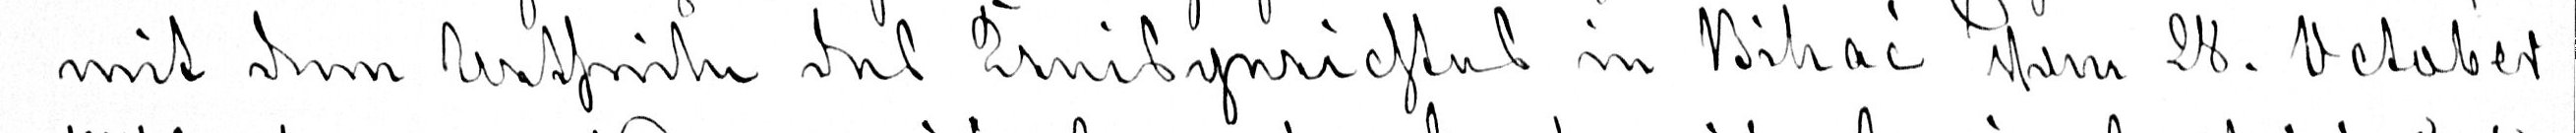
mit dem Urtheile des Kreisgerichtes in Bihać vom 28. October
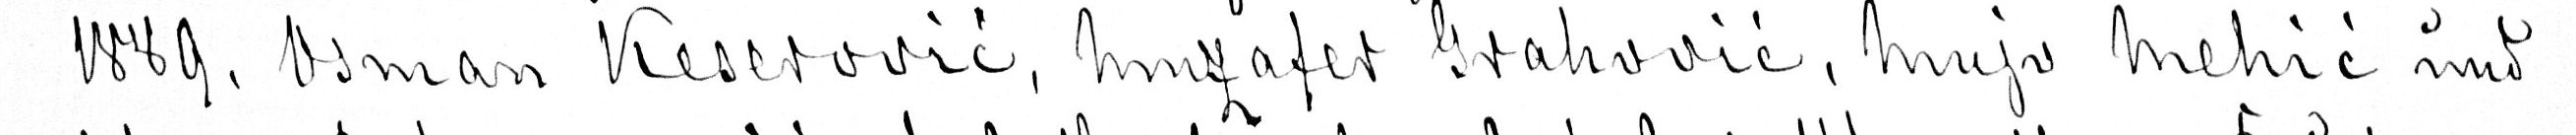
1889, Osman Keserović, Muzafer Grahović, Mujo Mehić und
